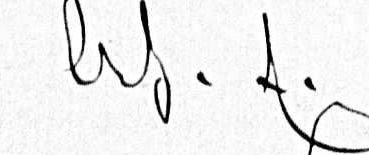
Ah E
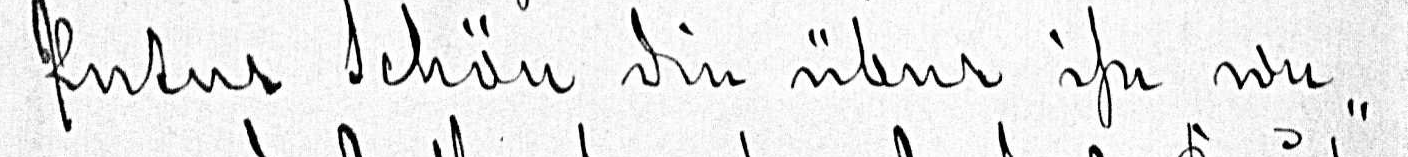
Peter Schön die über ihn we¬
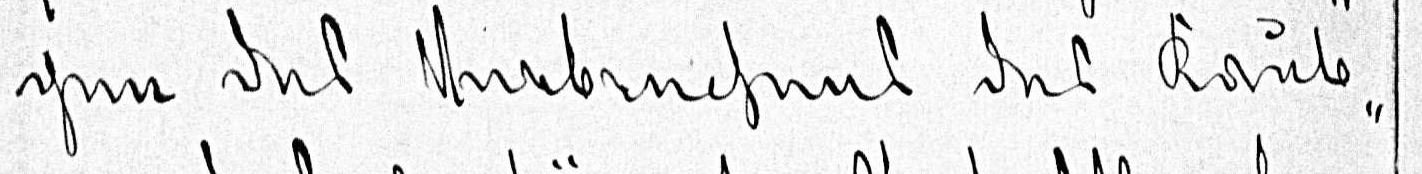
gen des Verbrechens des Raub¬
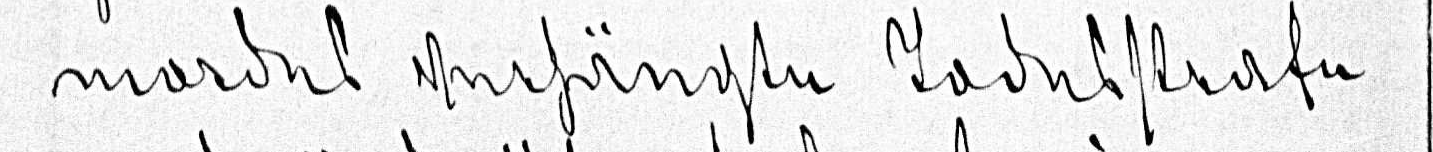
mordes verhängte Todesstrafe
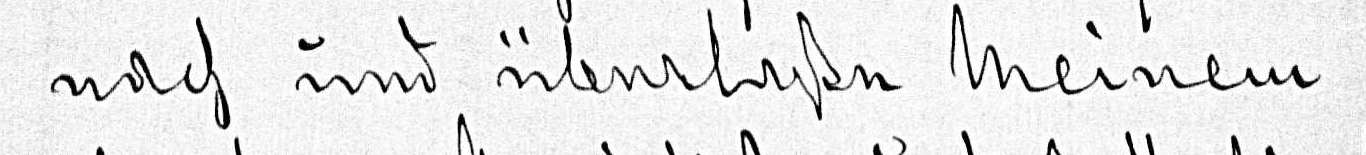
nach, und überlasse Meinem
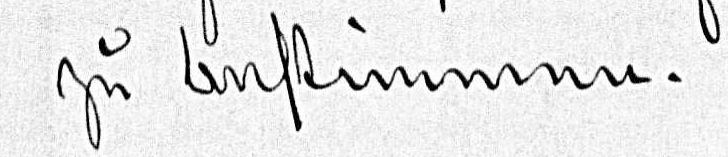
zu bestimmen.
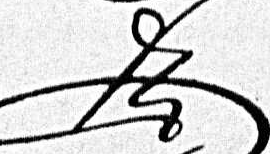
FJ
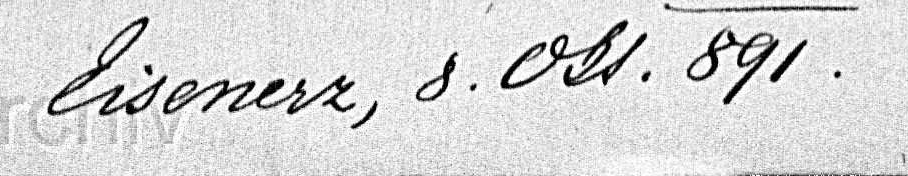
Eisenerz, 8. Okt. 1891
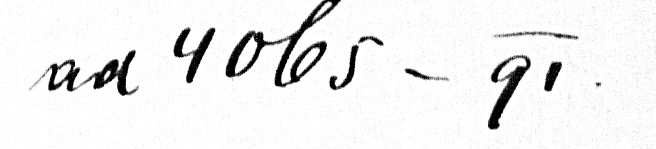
ad 4065 – 1891
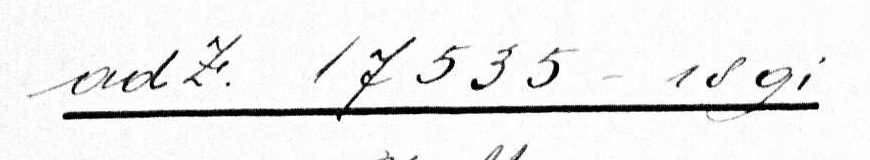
ad Z. 17535 – 1891/
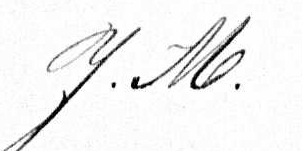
JM
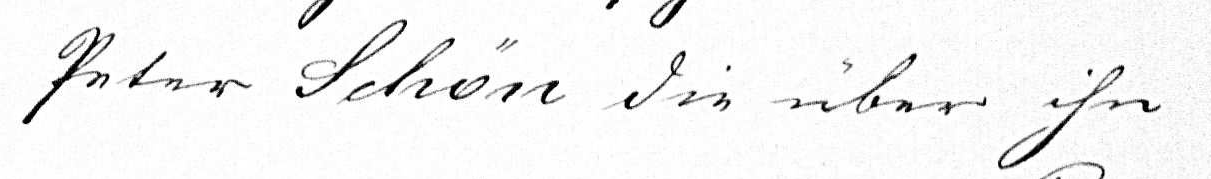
Peter Schön die über ihn
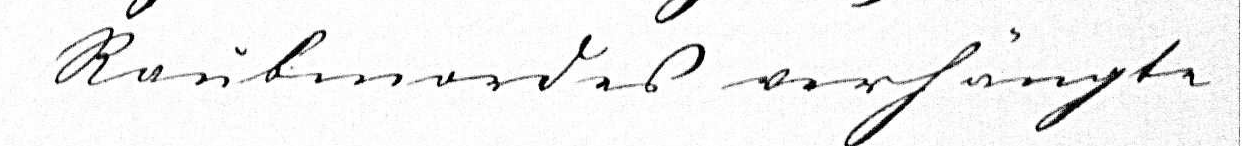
Raubmordes verhängte
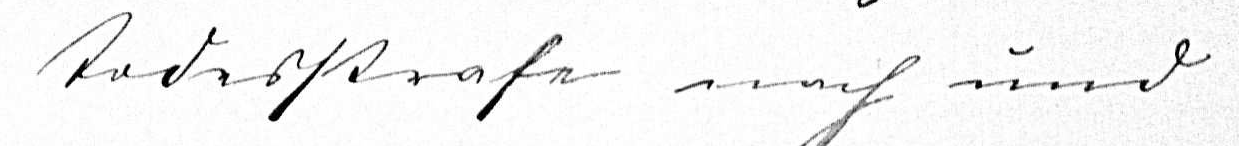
Todesstrafe nach, und
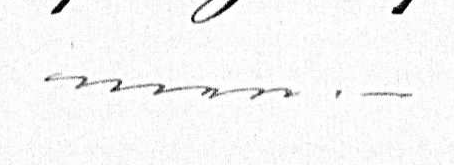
men. –
